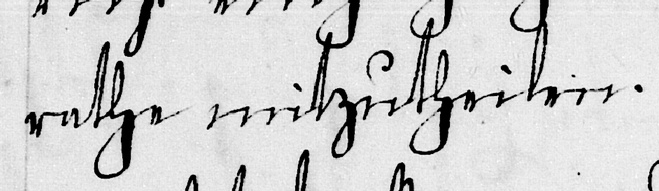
rathe mitzutheilen.
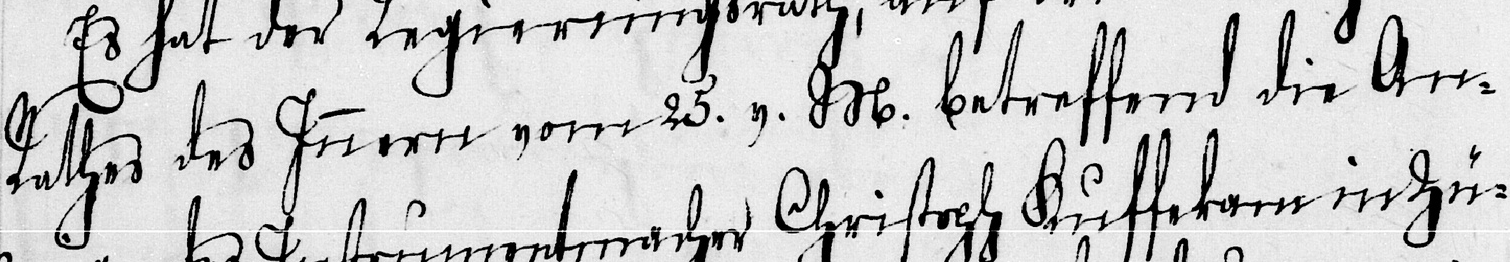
Rathes des Innern vom 25. v. M. betreffend die An¬
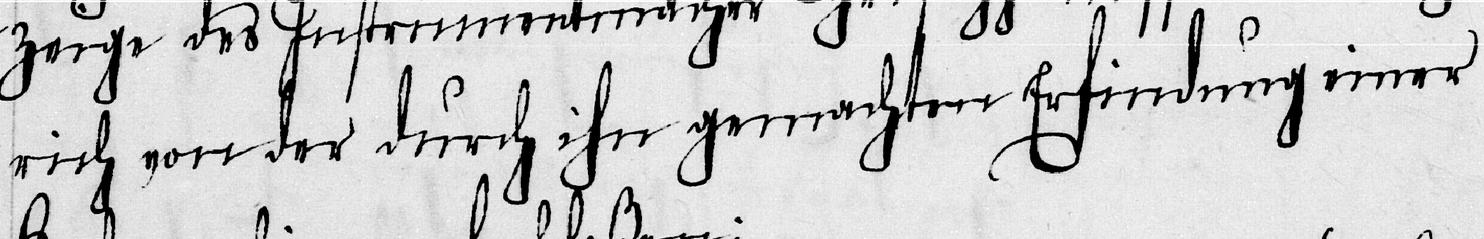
ürich von der durch ihn gemachten Erfindung einer
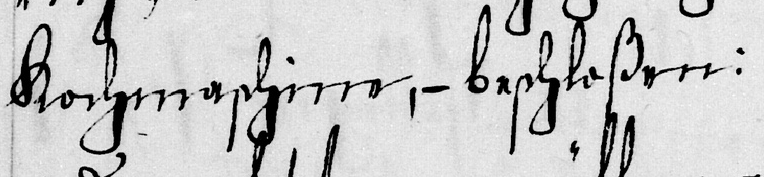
Kochmaschine, – beschloßen:
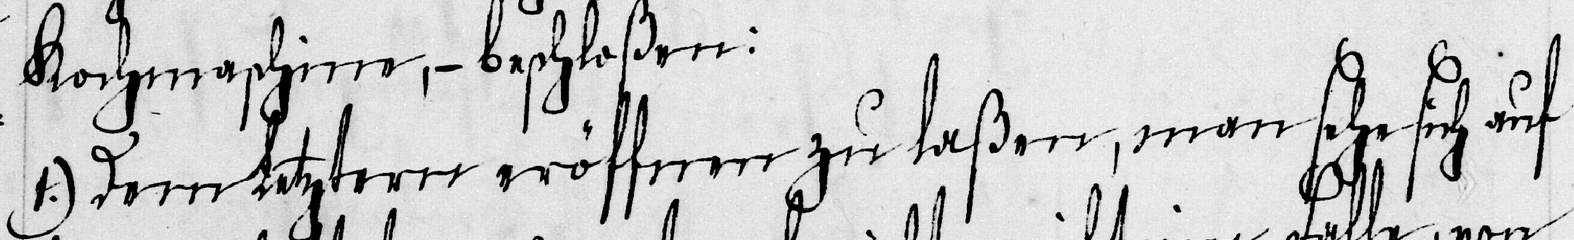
1.) Dem Letztern eröffnen zu laßen, man sehe sich auf
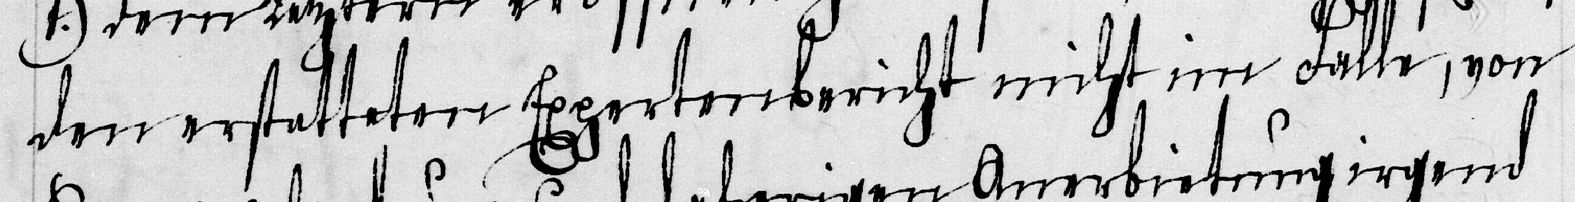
den erstatteten Expertenbericht nicht im Falle, von
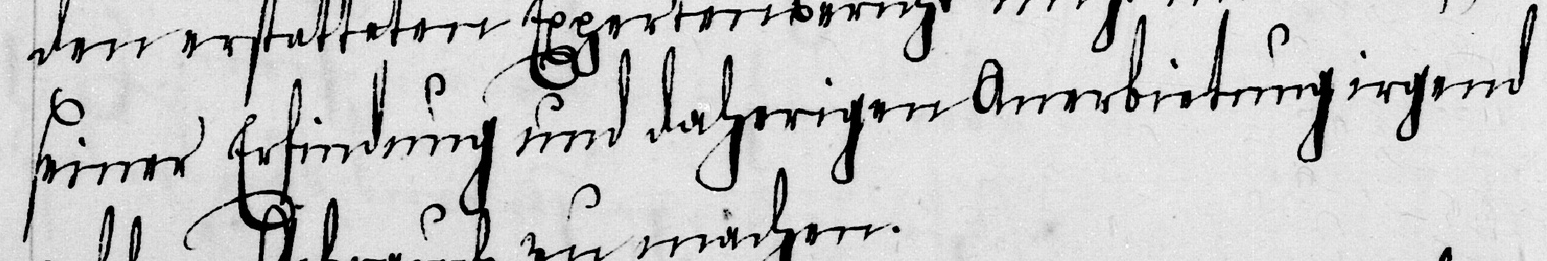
seiner Erfindung und daherigen Anerbietung irgend
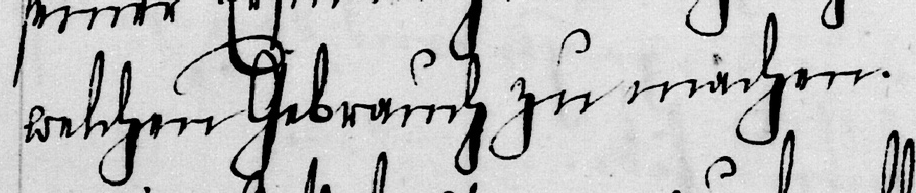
welchen Gebrauch zu machen.
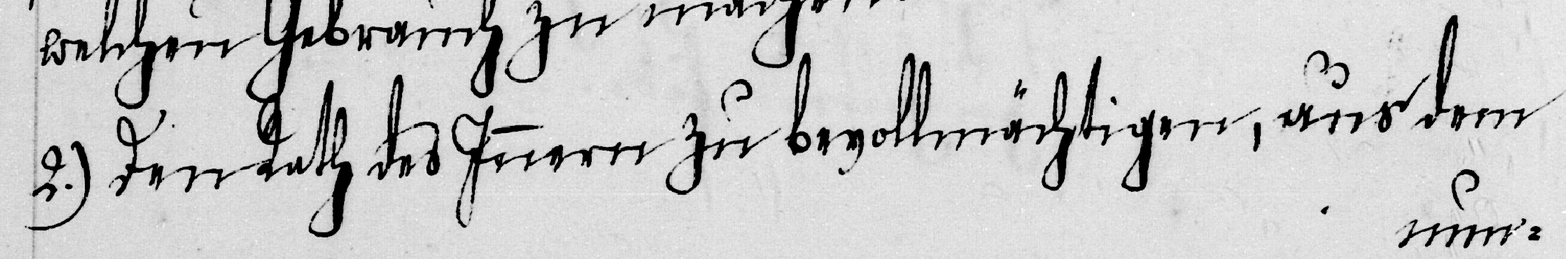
2.) Den Rath des Innern zu bevollmächtigen, aus dem
